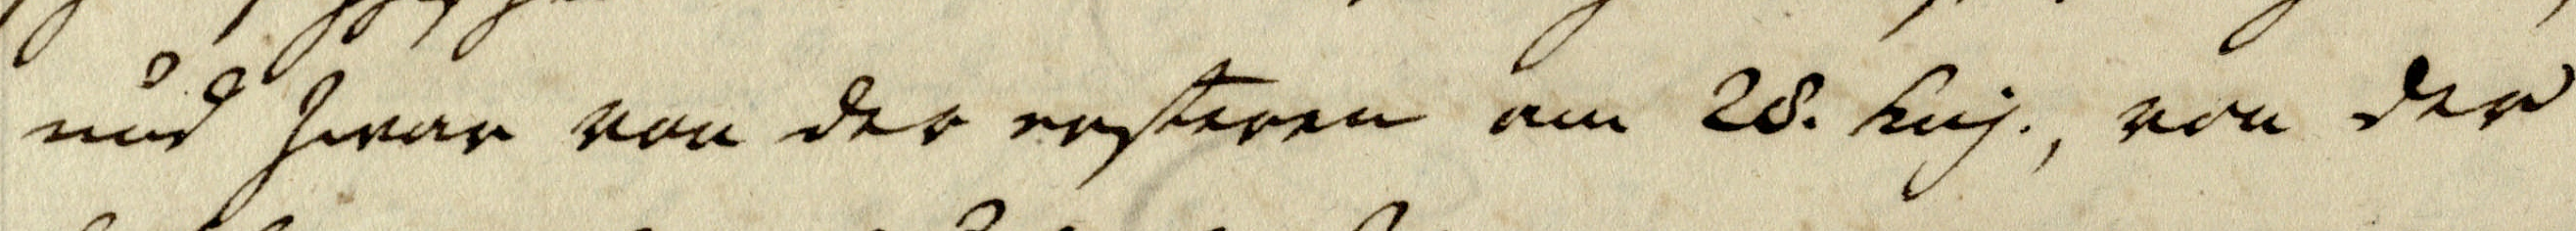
und zwar von der ersteren am 28. huj., von der
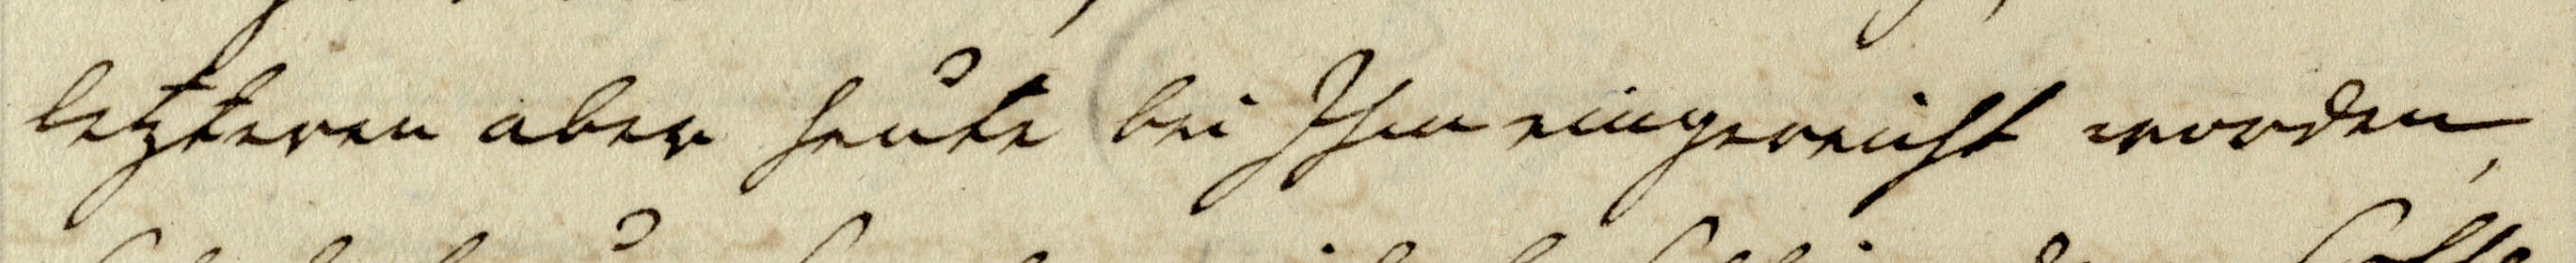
letzteren aber heute bei Ihm eingereicht worden,
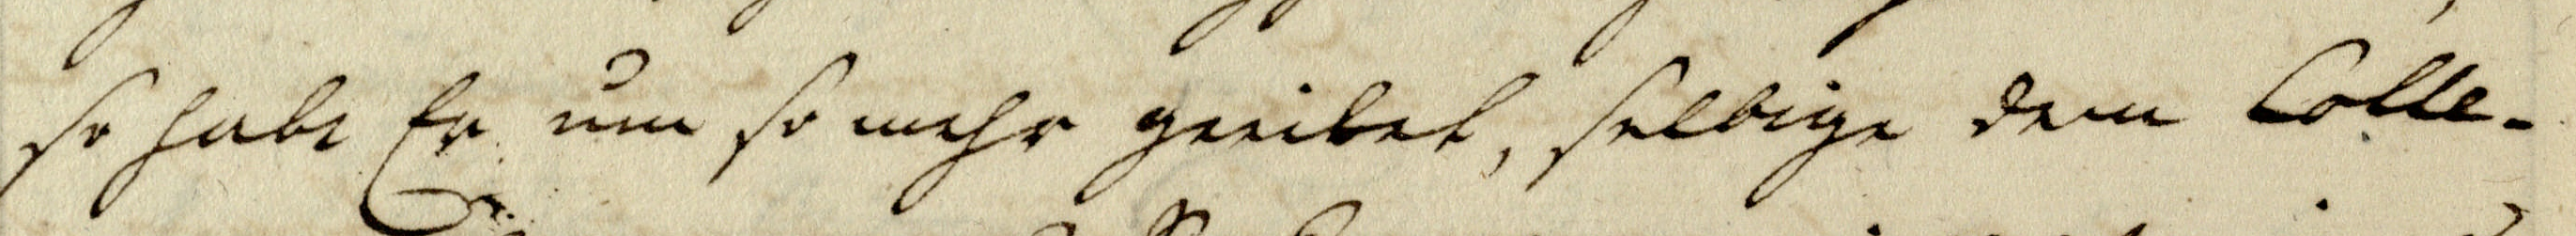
so habe Er um so mehr geeilet, selbige dem Colle¬
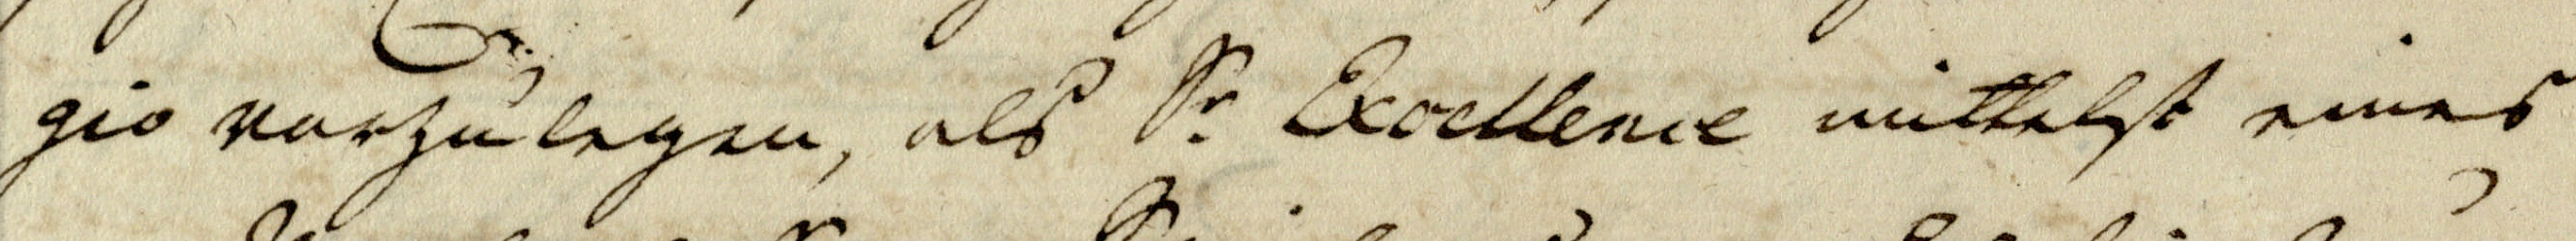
gio vorzulegen, als Sr Excellence mittelst eines
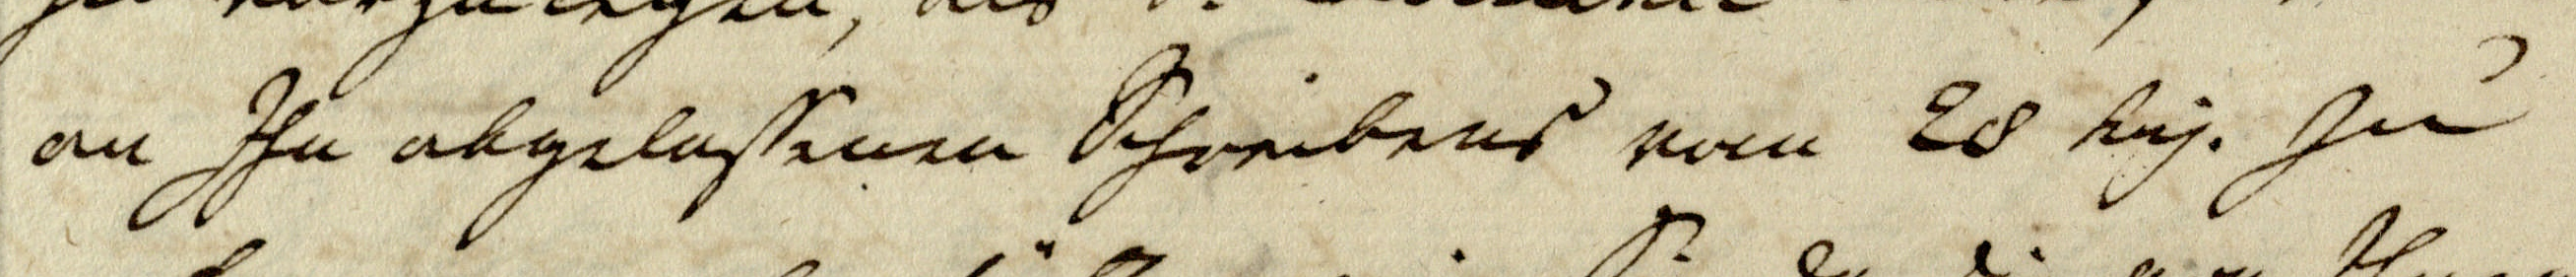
an Ihn abgelassenen Schreibens vom 28 huj. zu
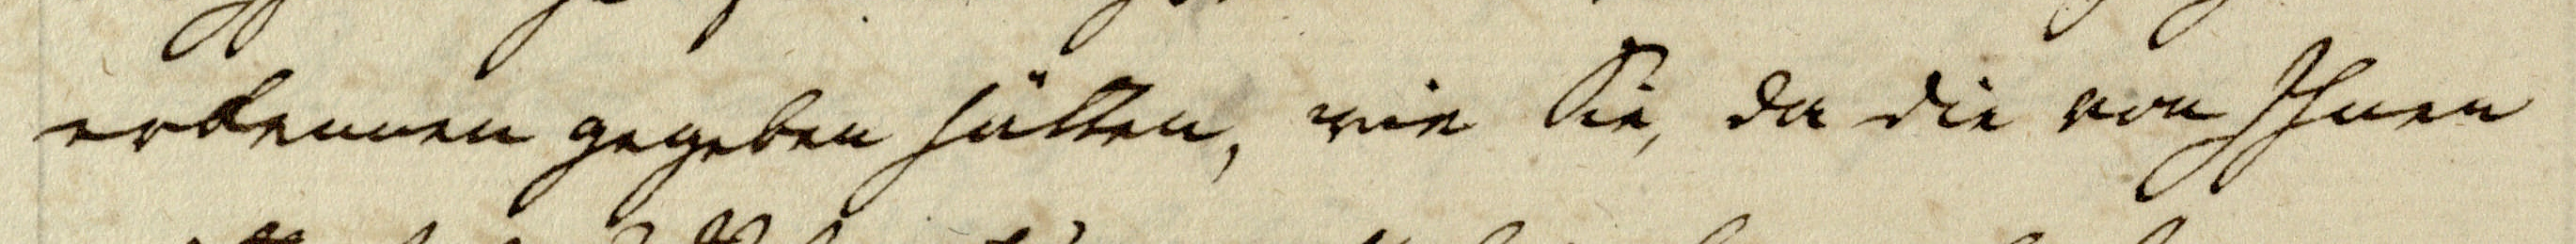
erkennen gegeben hätten, wie Sie da die von Ihnen
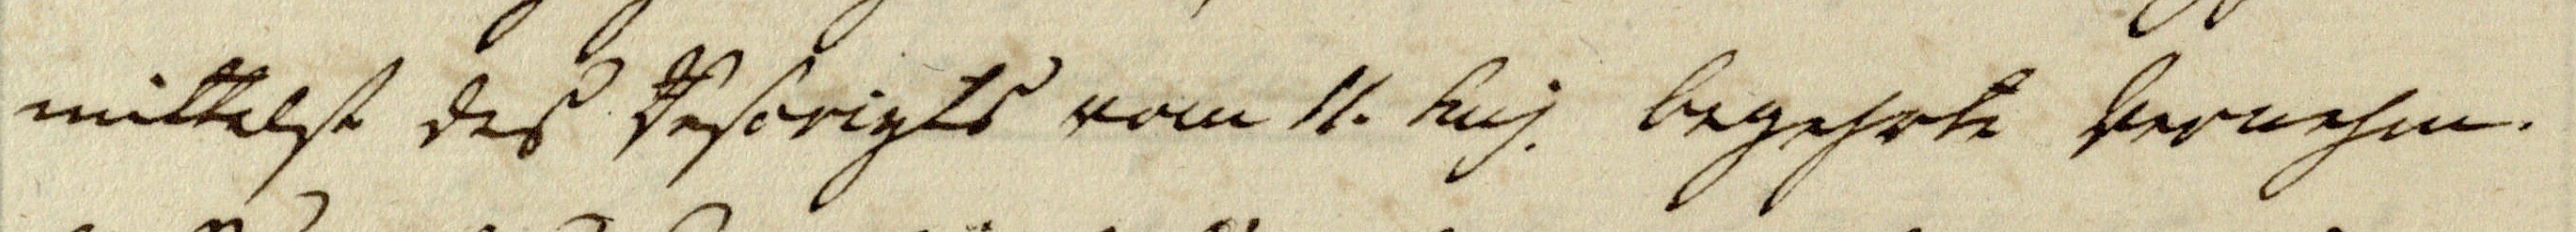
mittelst des Rescripts vom 11. huj. begehrte Vernehm¬
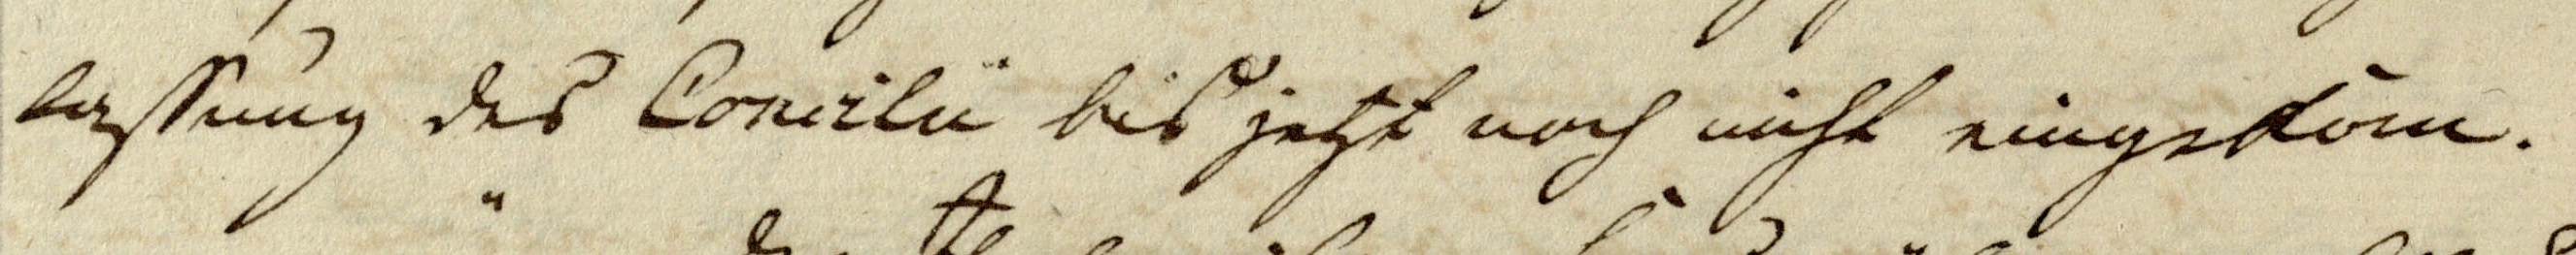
lassung des Concilii bis jetzt noch nicht eingekom
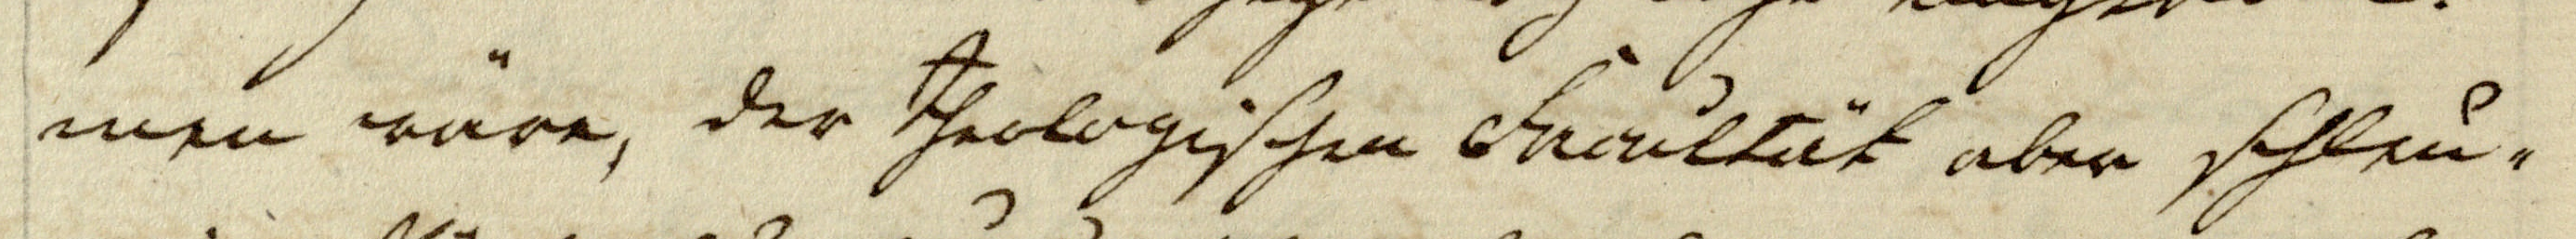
men wäre, der Theologischen Facultät aber schleu¬
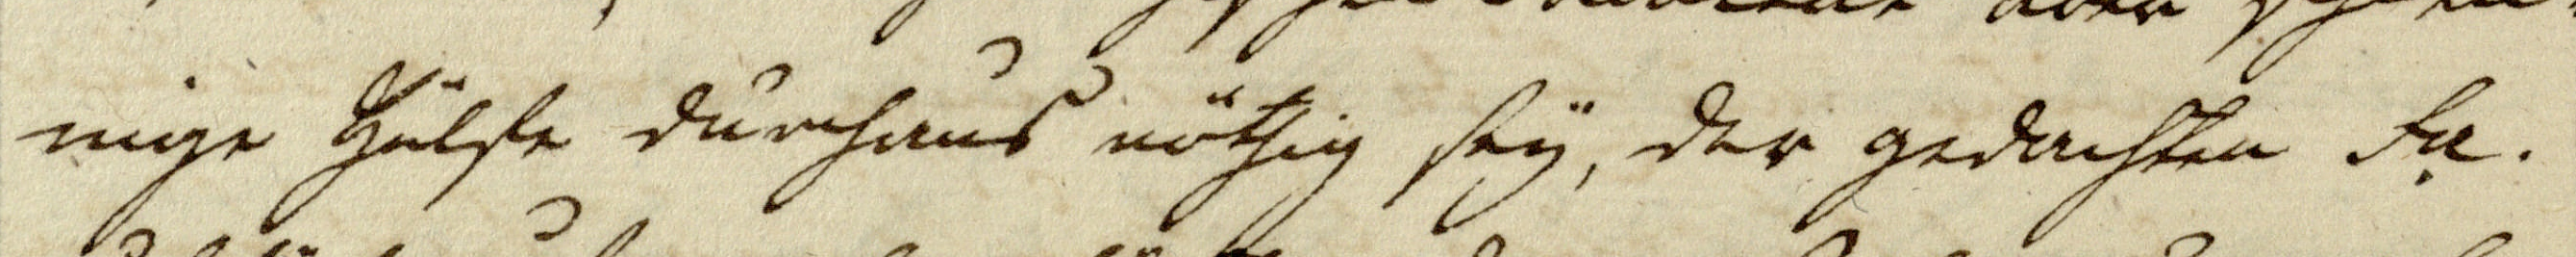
nige Hülfe durchaus nöthig seÿ, der gedachten Fa¬
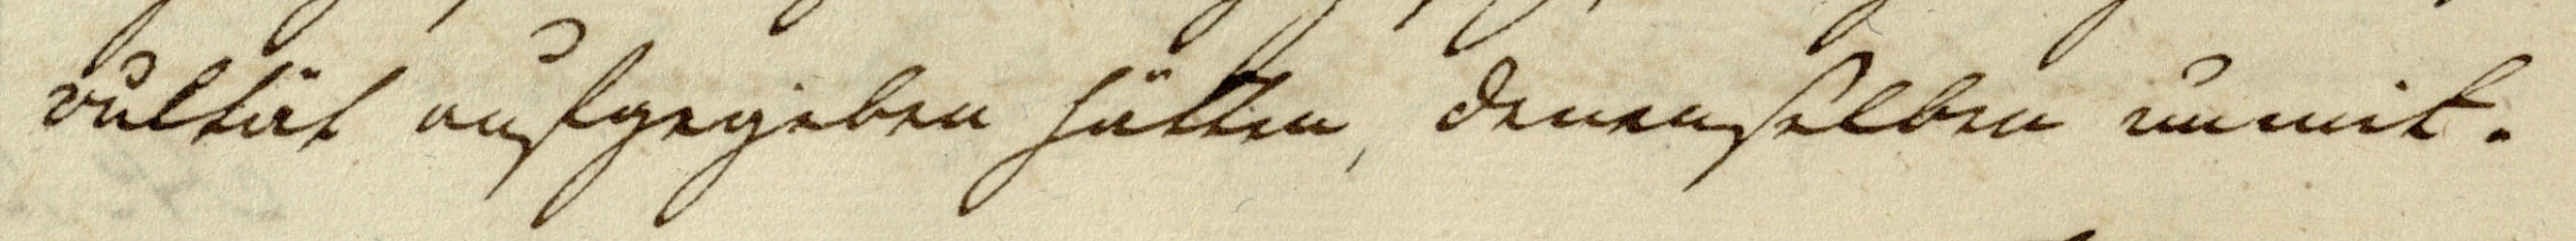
cultät aufgegeben hätten, denenselben unmit¬
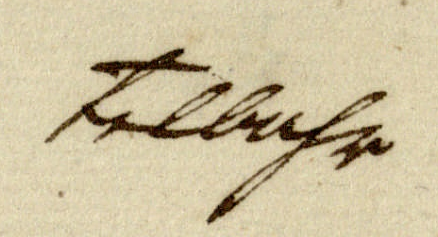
telbahr
